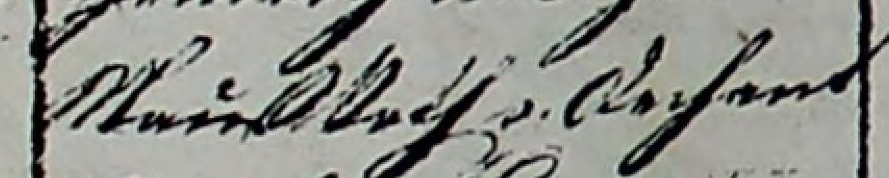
Mauskoth v. ???hant
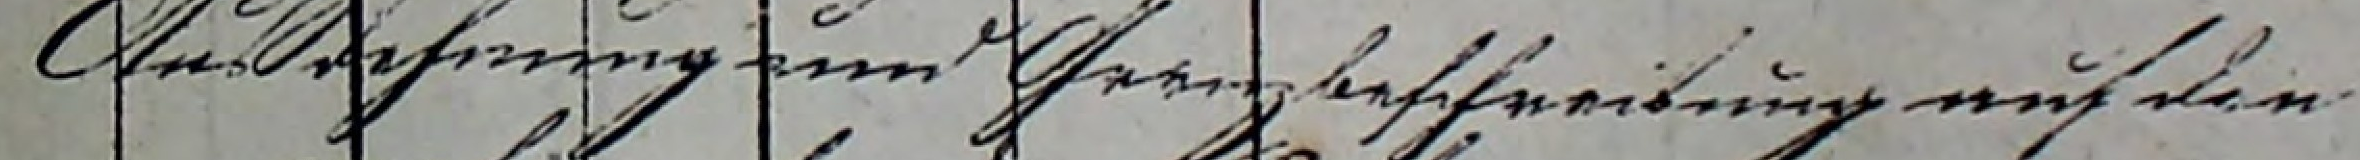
Ausdehnung und Grenzbeschreibung auf den
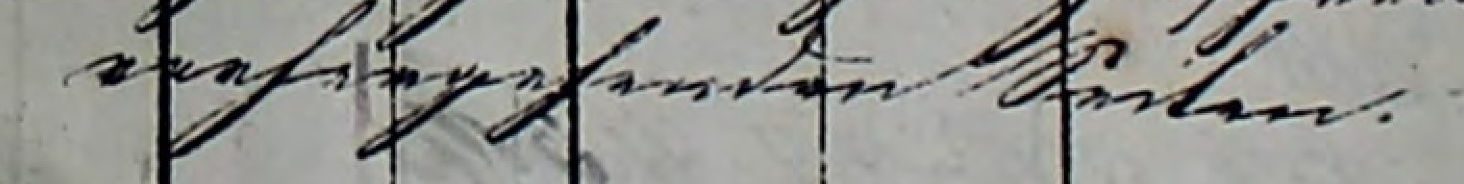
vorhergehenden Seiten.
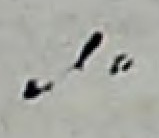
do
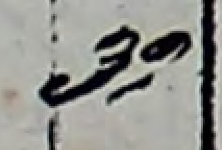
32
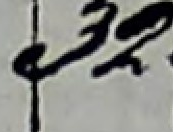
32
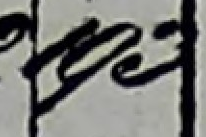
193
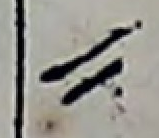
4
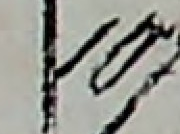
107
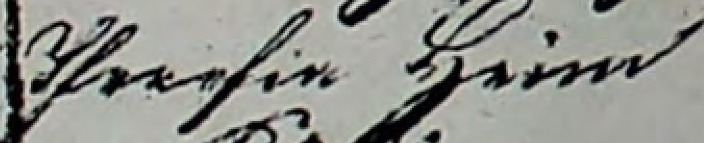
Theresia Heim
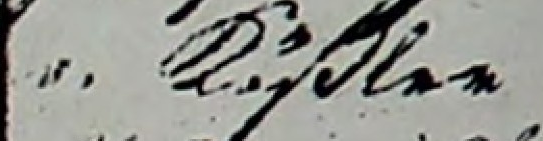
v. Kößler
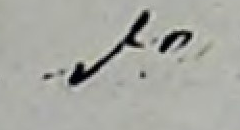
do
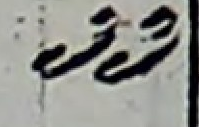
33
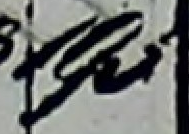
195
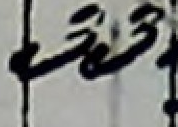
33
